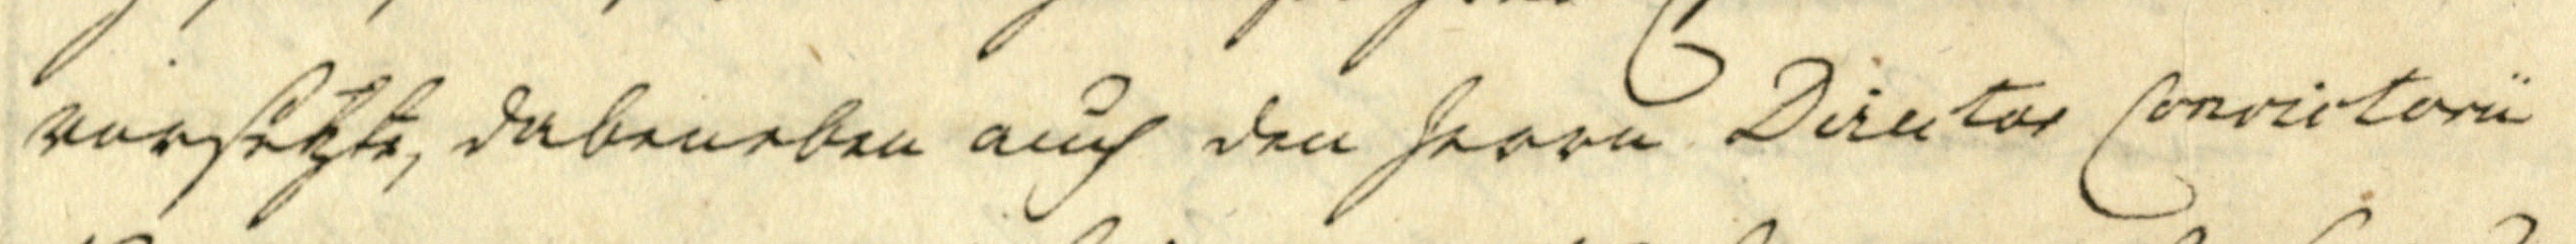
vorsetzte, dabeneben auch den Herrn Director Convictorii
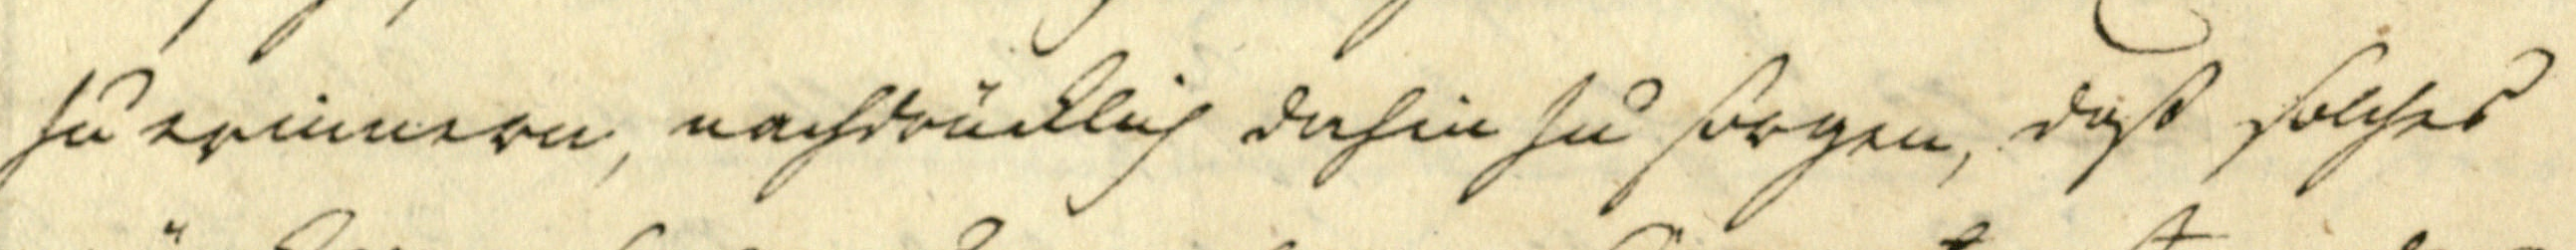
zu erinnern, nachdrücklich dahin zu sorgen, daß solches
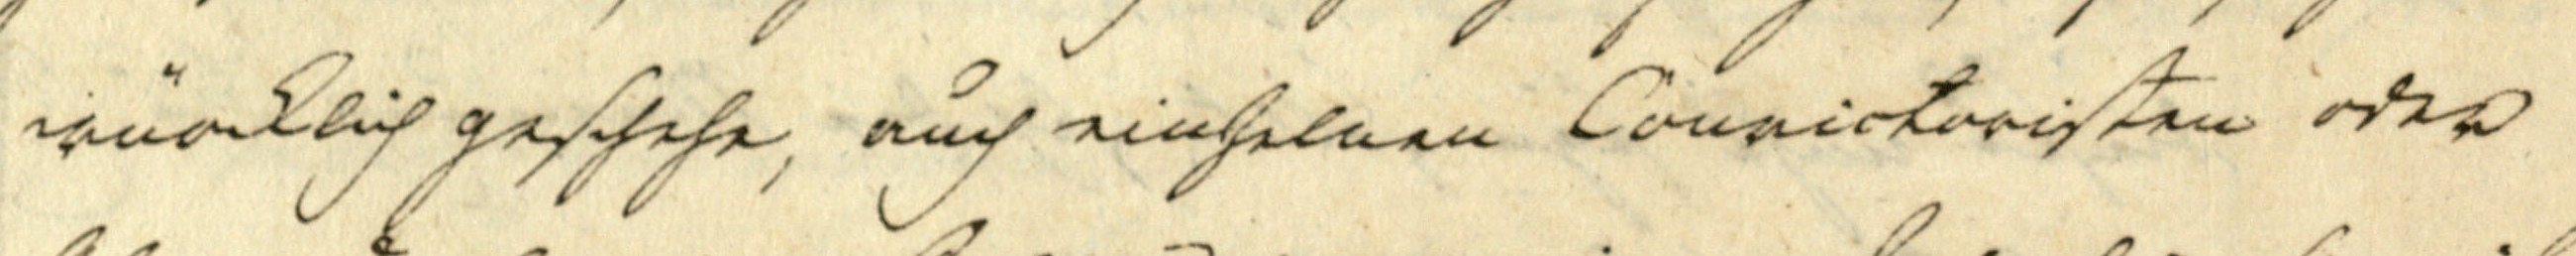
würcklich geschehe, auch einzelnen Convictoristen oder
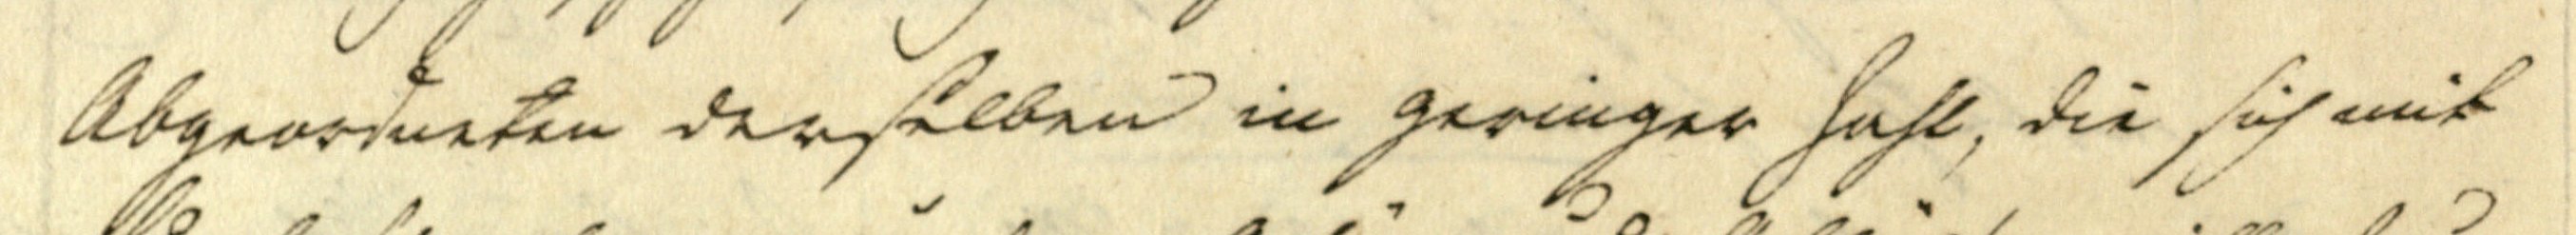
Abgeordneten derselben in geringer Zahl, die sich mit
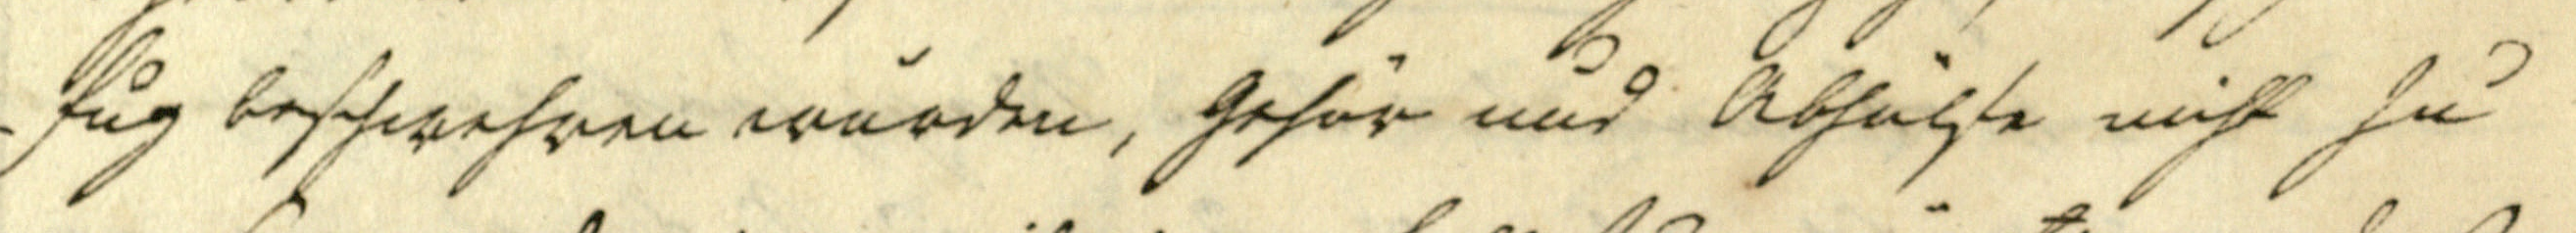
Fug beschwehren würden, Gehör und Abhülfe nicht zu
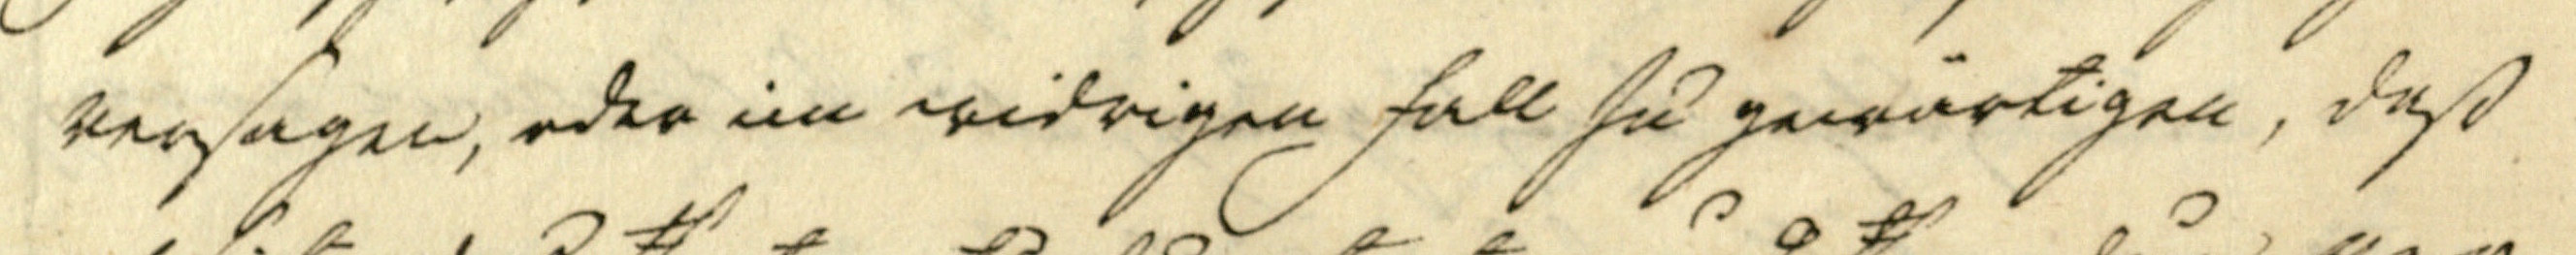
versagen, oder im widrigen Fall zu gewärtigen, daß
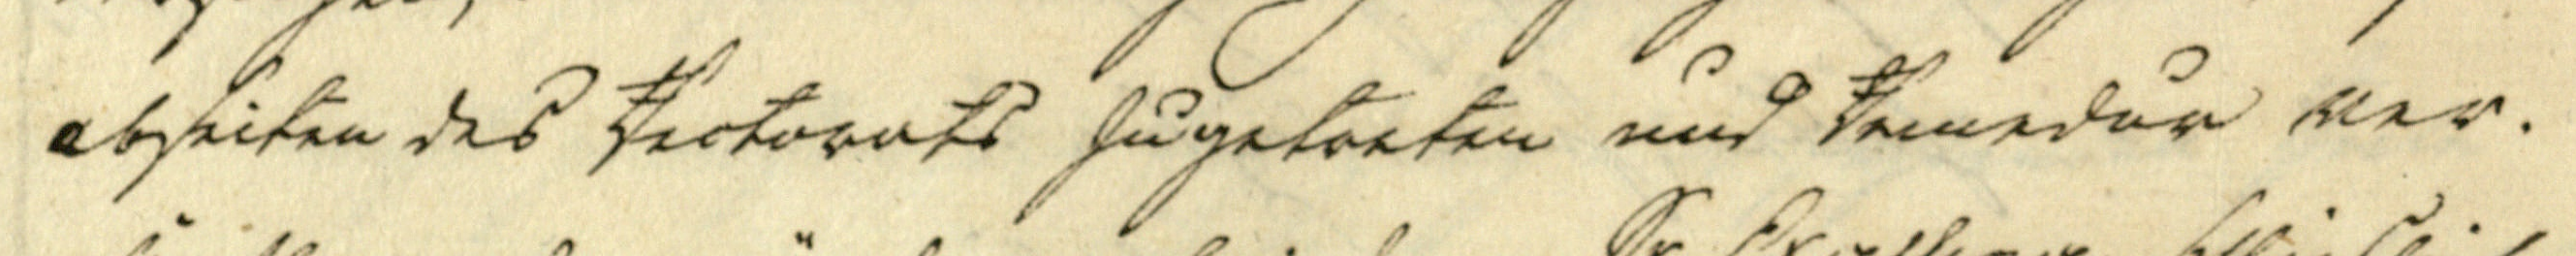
abseiten des Rectorats zugetreten und Remedur ver¬
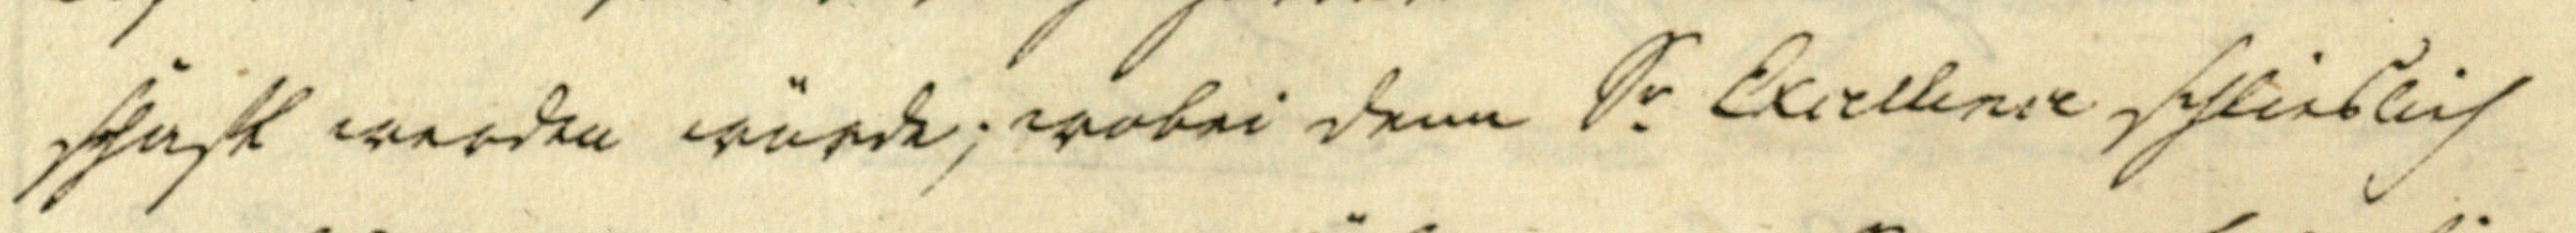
schaft werden würde; wobei denn Sr Excellence schlieslich
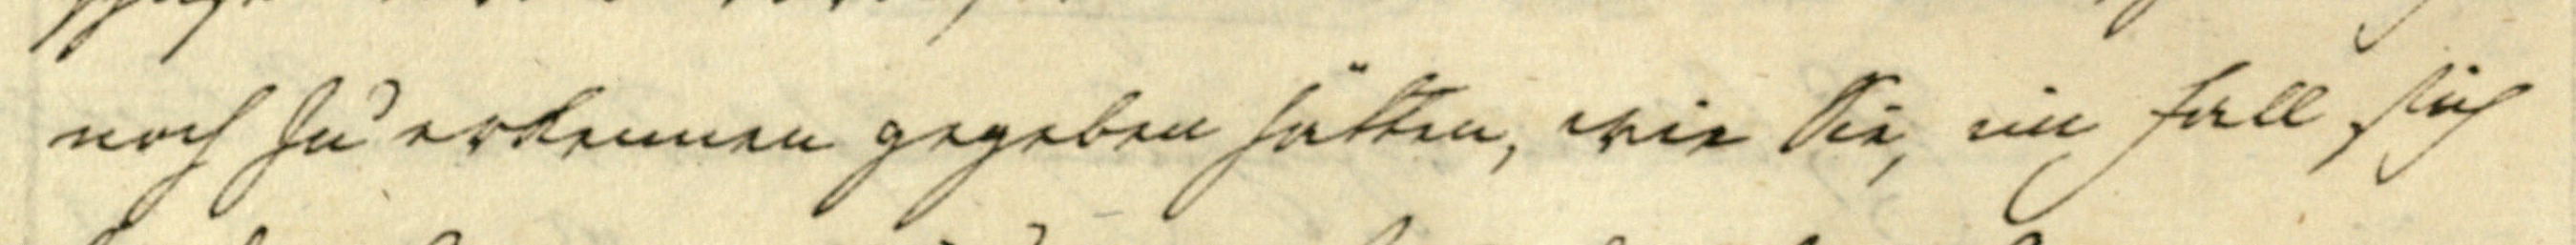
noch zu erkennen gegeben hätten, wie Sie, im Fall sich
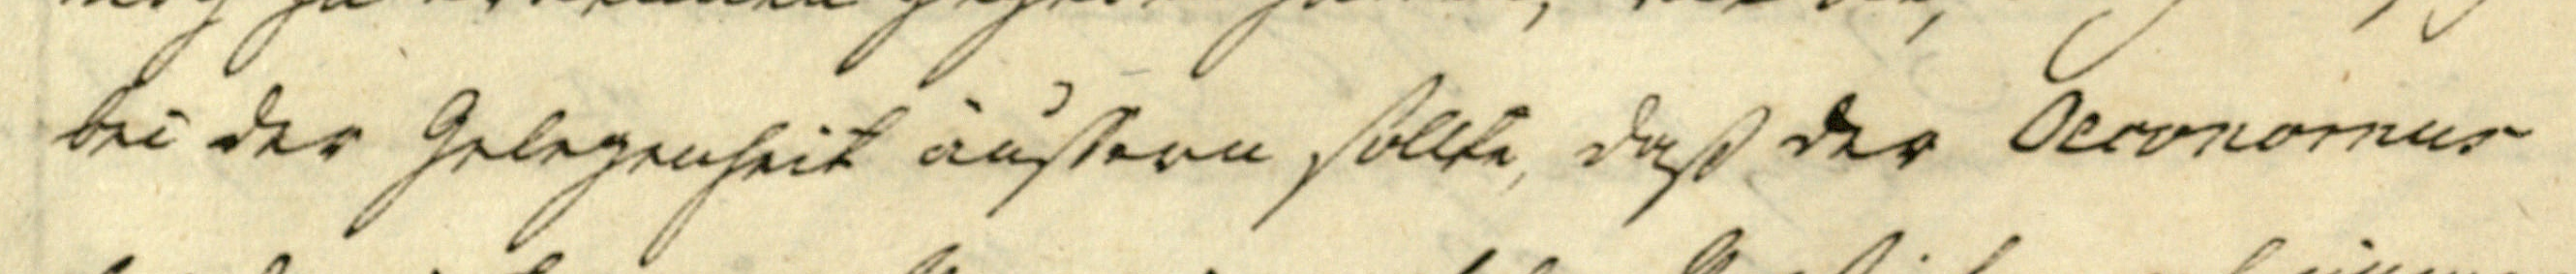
bei der Gelegenheit äussern sollte, daß der Oeconomus
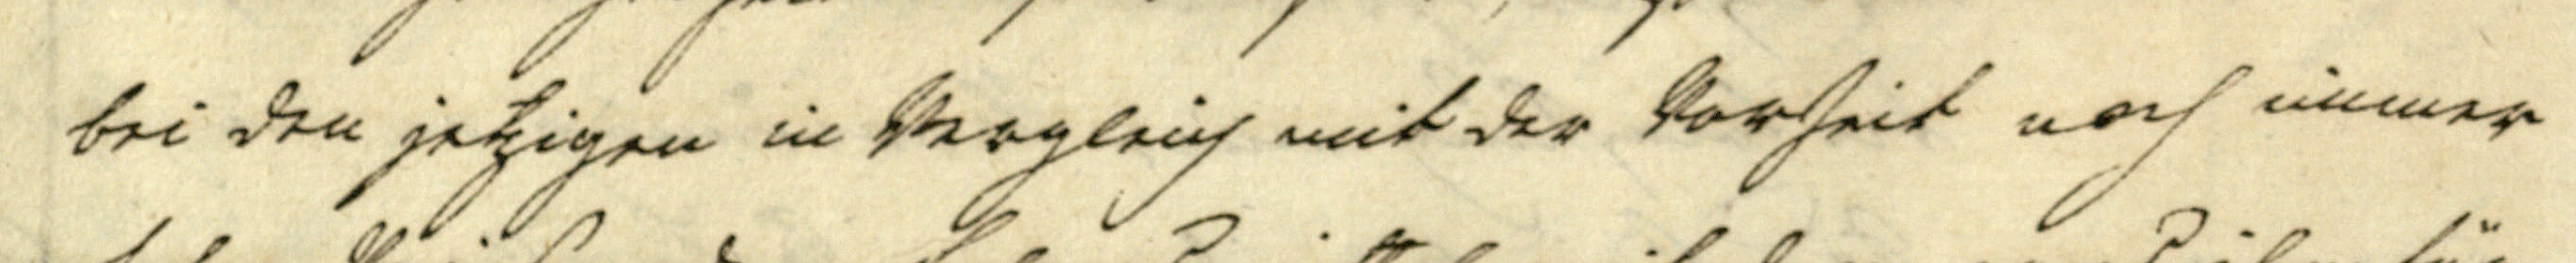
bei den jetzigen in Vergleich mit der Vorzeit noch immer
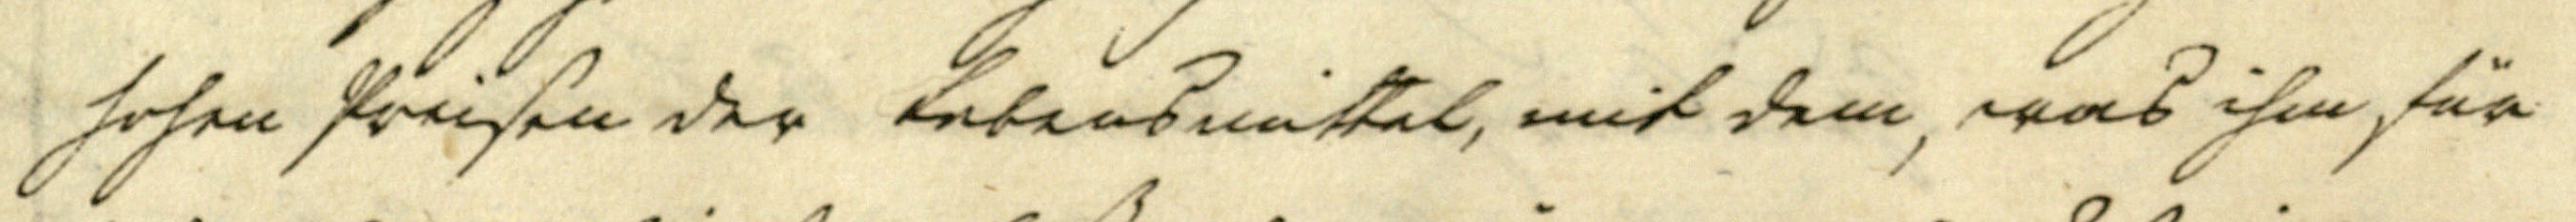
hohen Preisen der Lebensmittel, mit dem, was ihm für
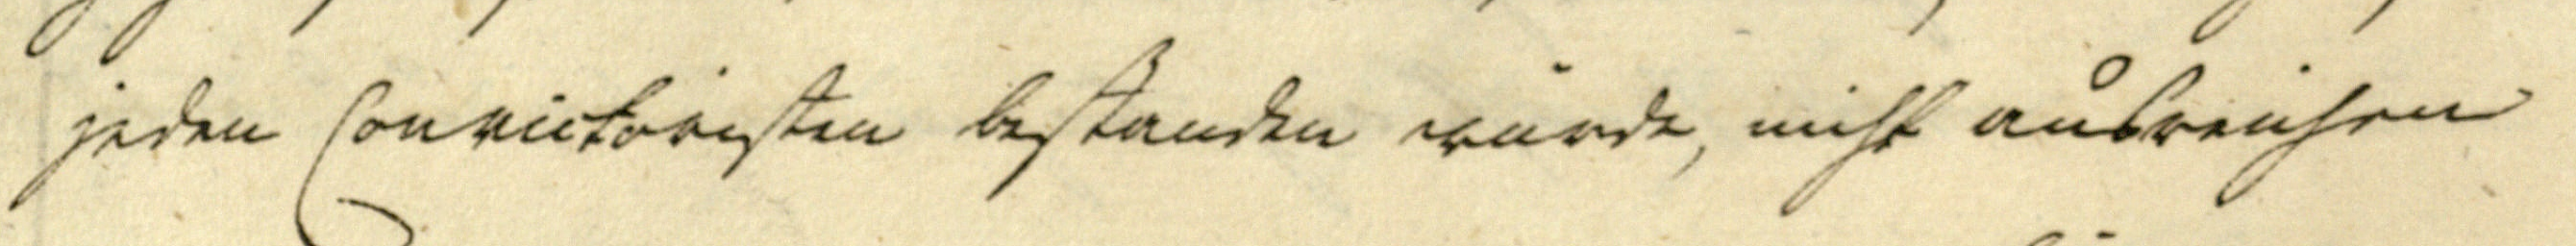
jeden Convictoristen bestanden würde, nicht ausreichen
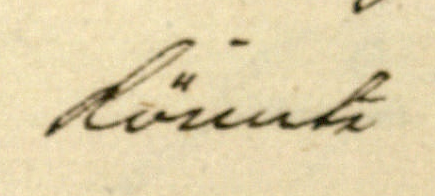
könnte
